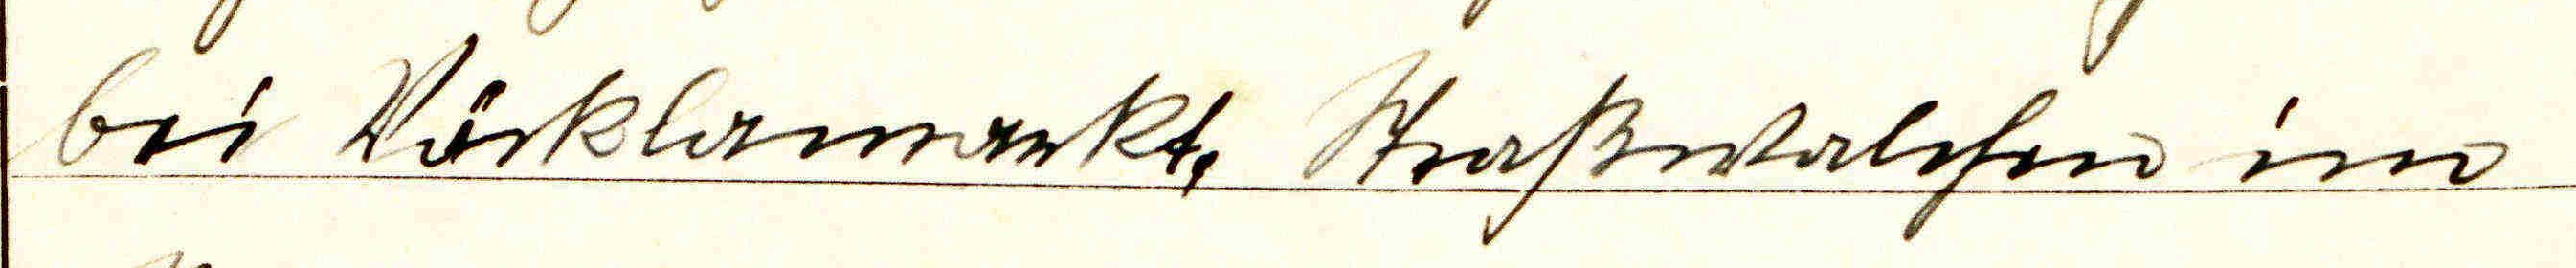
bei Vöklamarkt, Straßwalchen imbei Vöklamarkt, Straßwalchen im
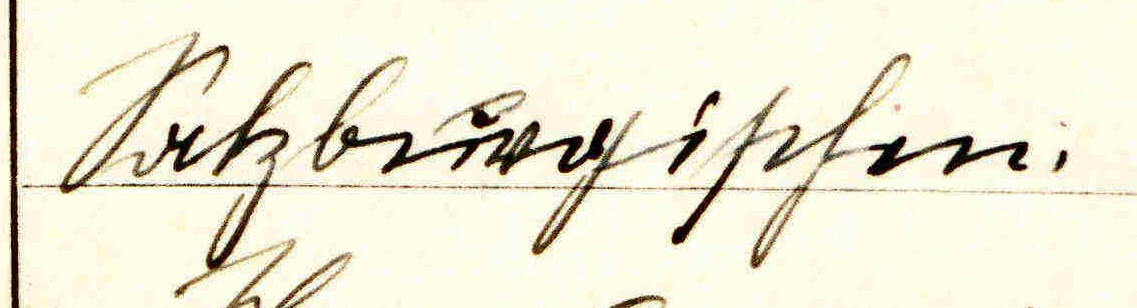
Salzburgischen.
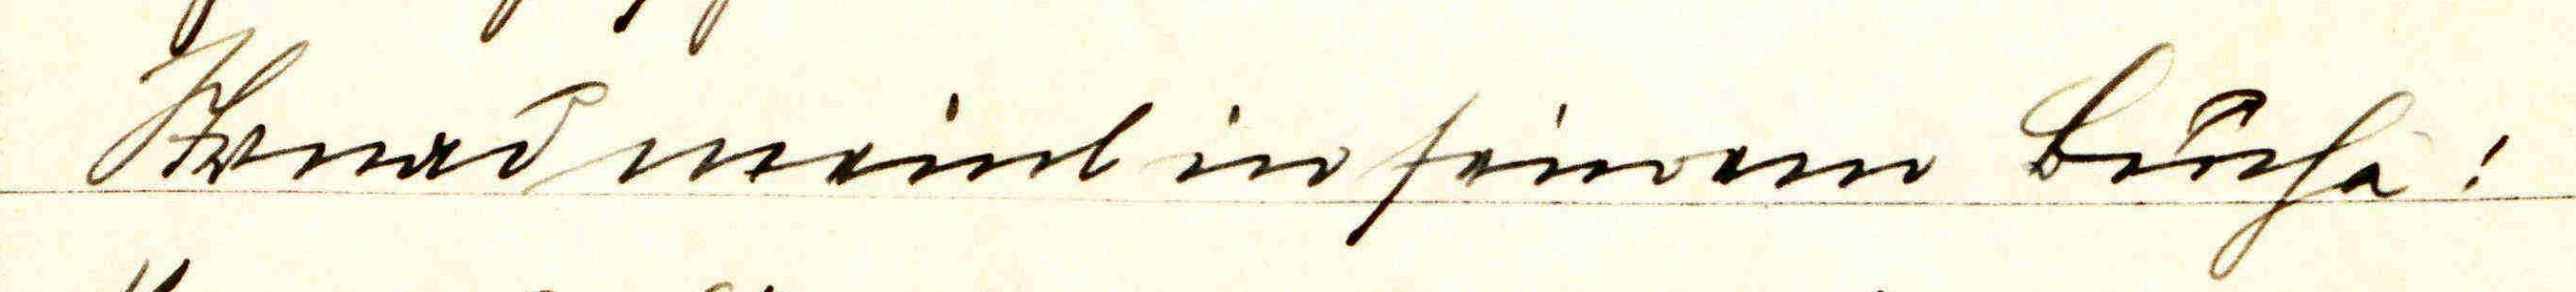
Strnad meint in seinem Buche:
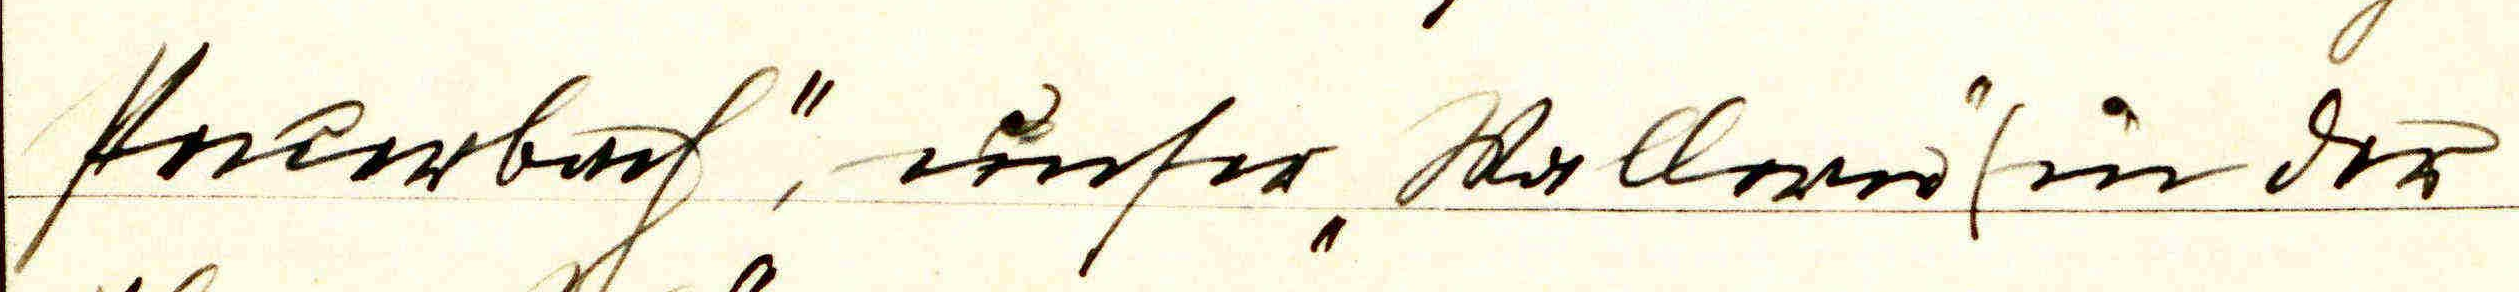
„Peuerbach“, unser Wallern“ (in der
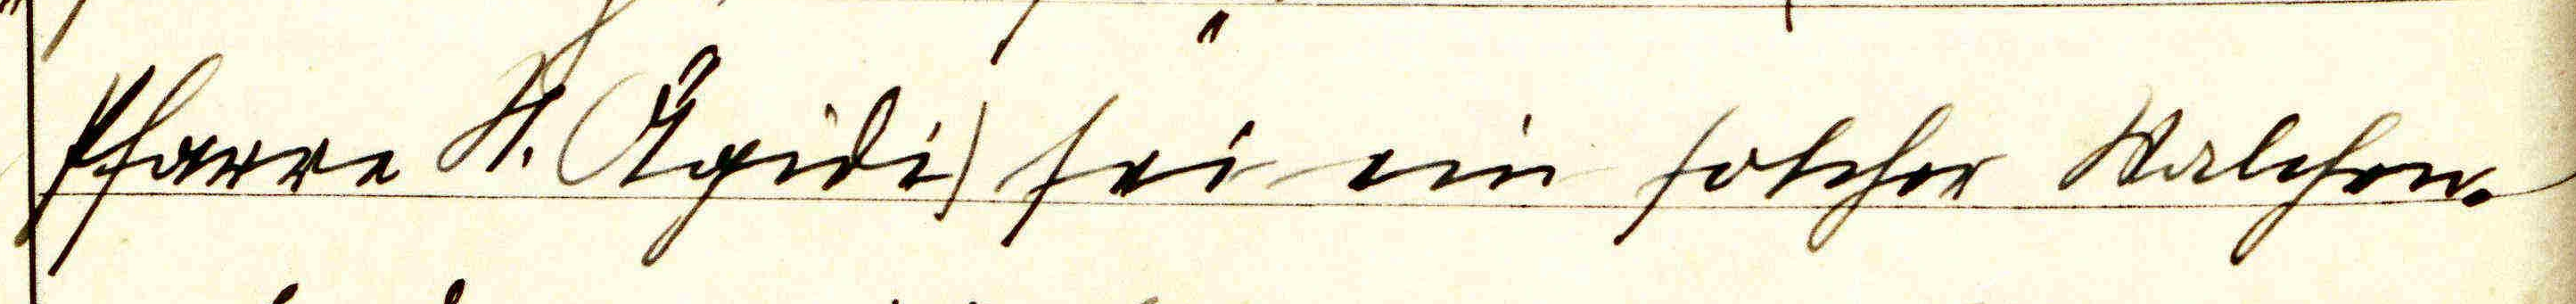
Pfarre St. Ägidi) sei ein solcher Walchen-
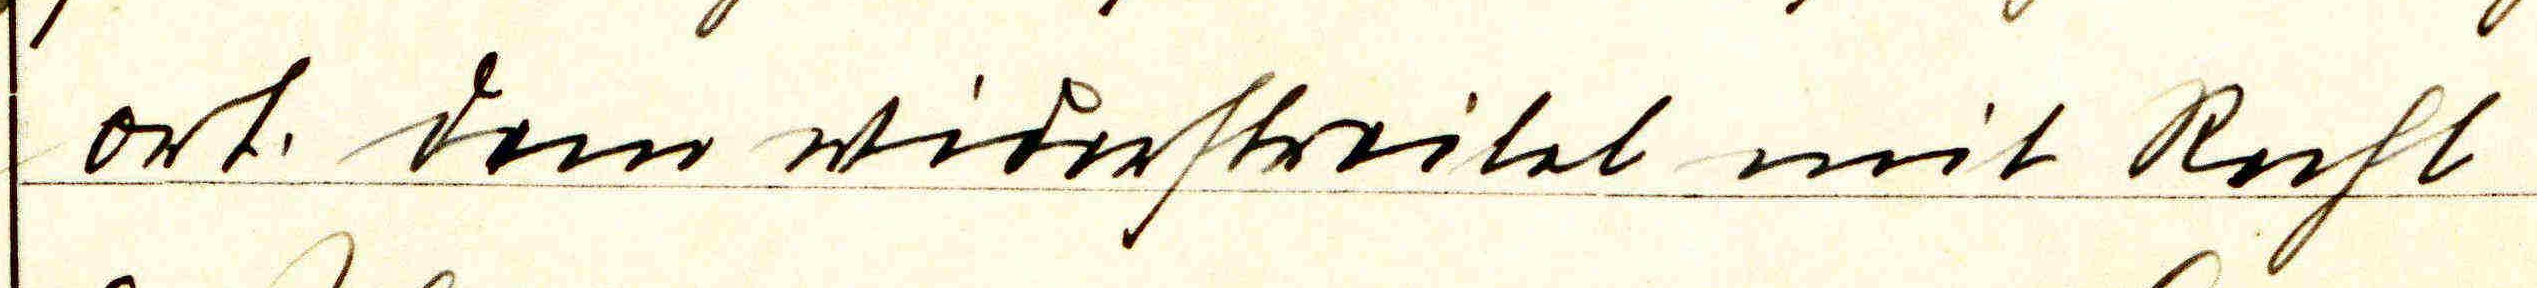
ort. Dem widerstreitet mit Recht
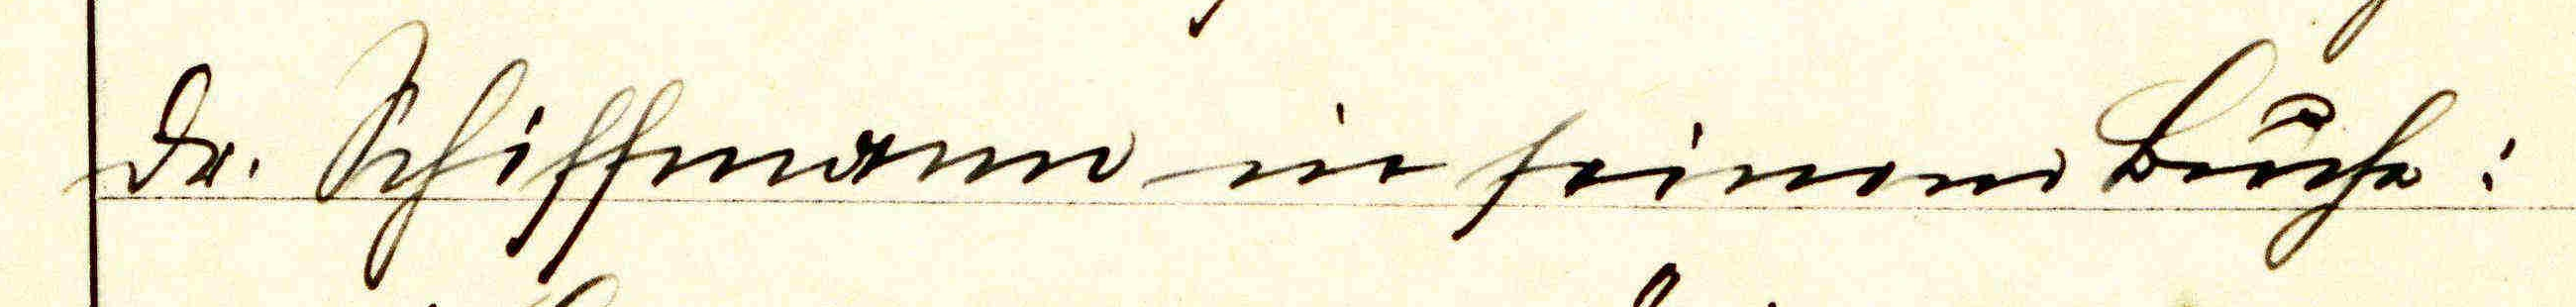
Dr. Schiffmann in seinem Buche:
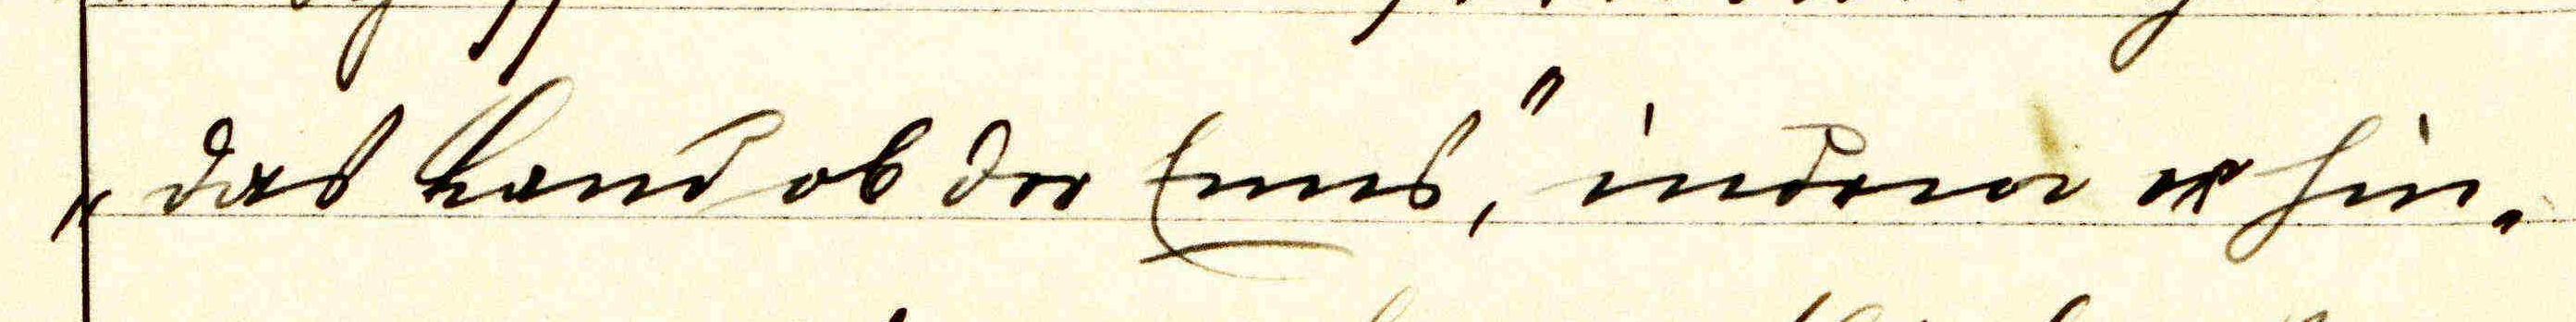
„Das Land ob der Enns“, indem er hin-
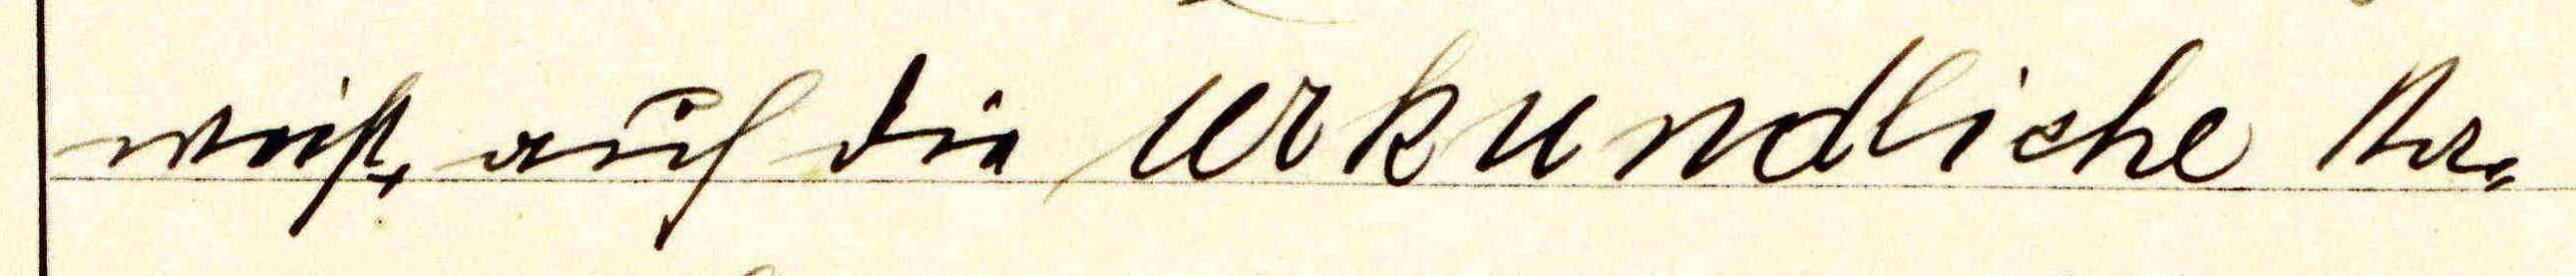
weist, auf die urkundliche Na-
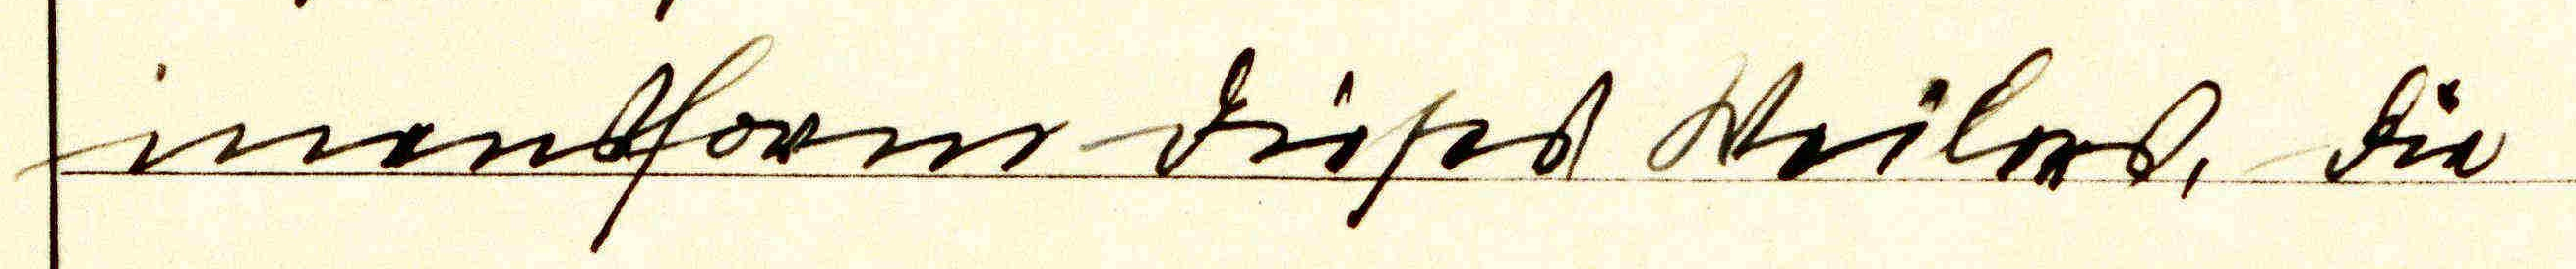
mensform diese Weilers, die
